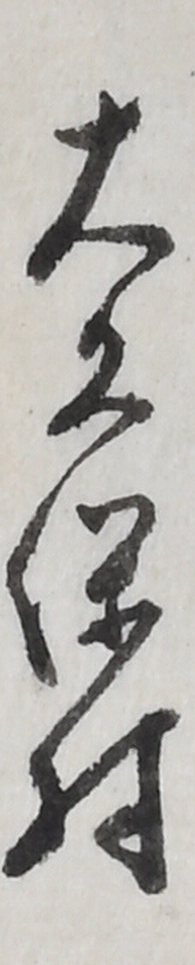大久保村
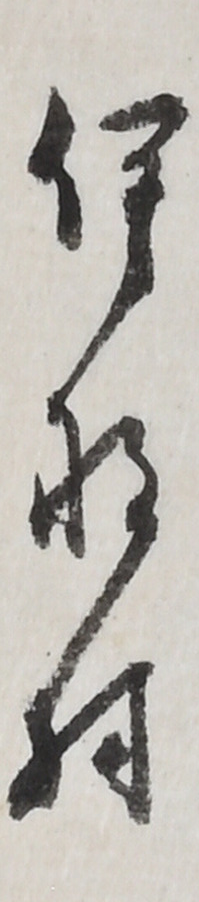伊那村
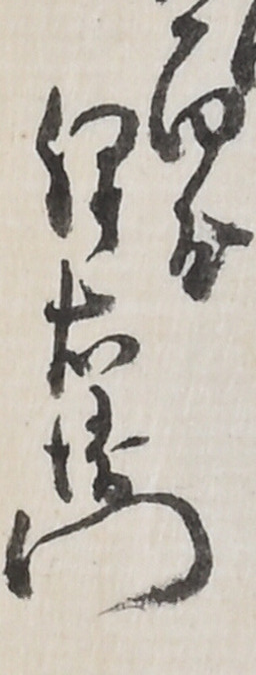伊右衛門
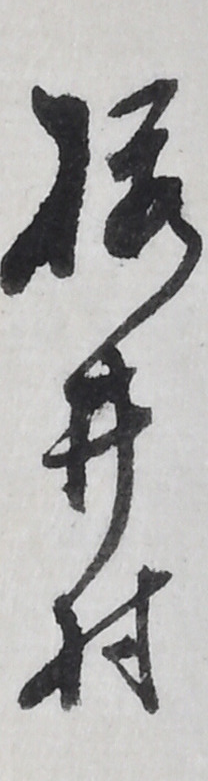桜井村
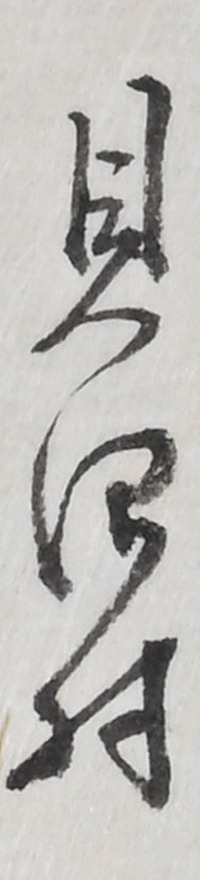貝沼村
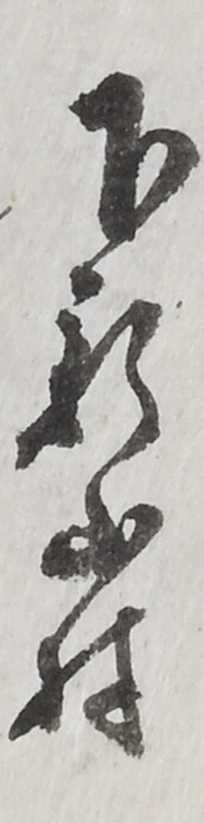上新山村
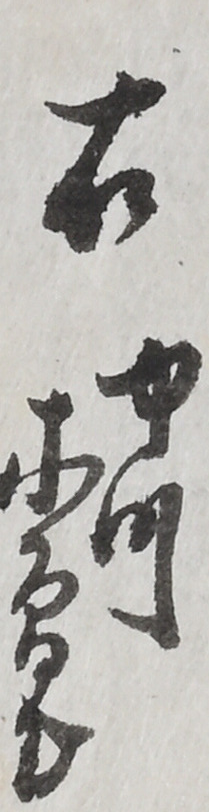右中町
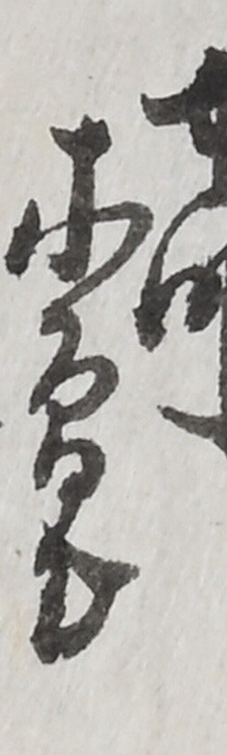木曽屋
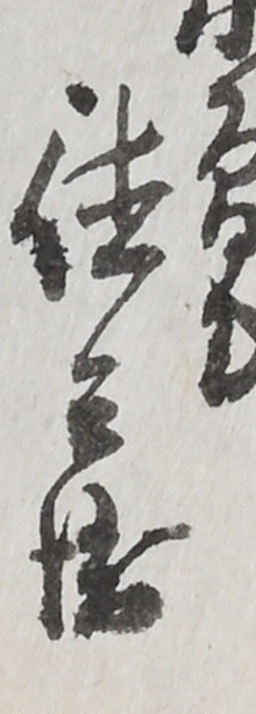徳兵衛
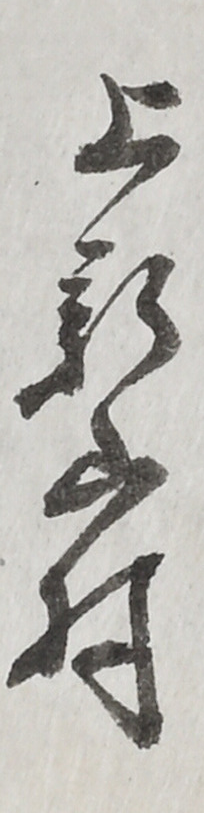上新山村
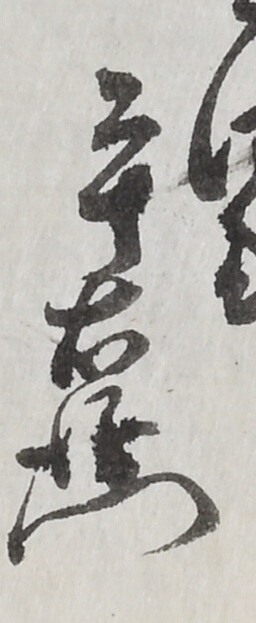平右衛門

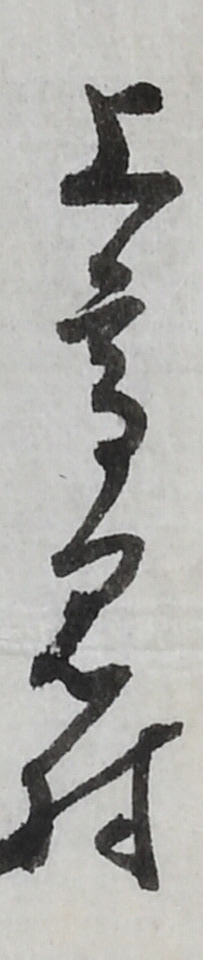上高見村
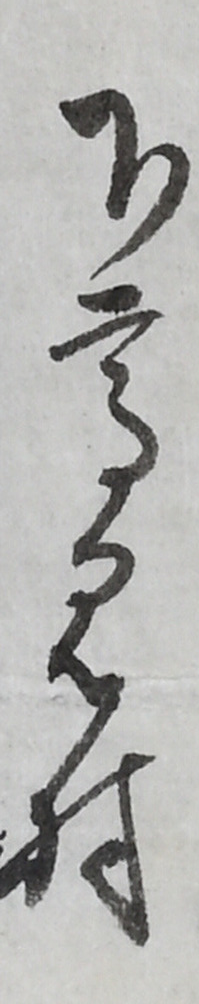下高見村
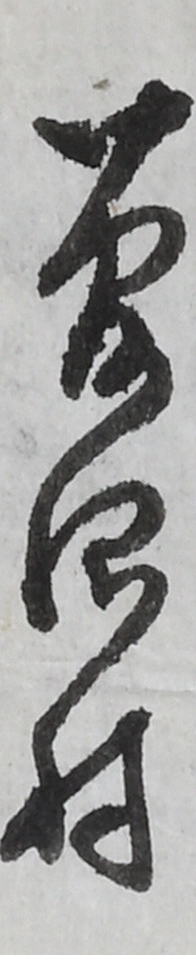菅沼村
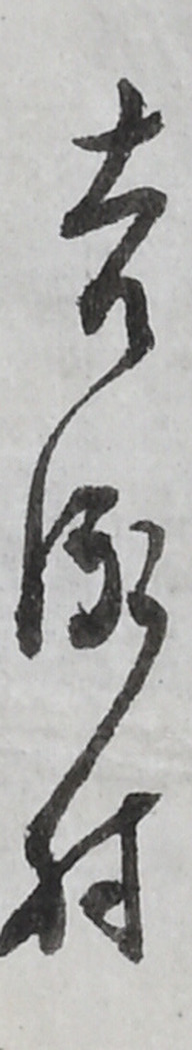吉瀬村
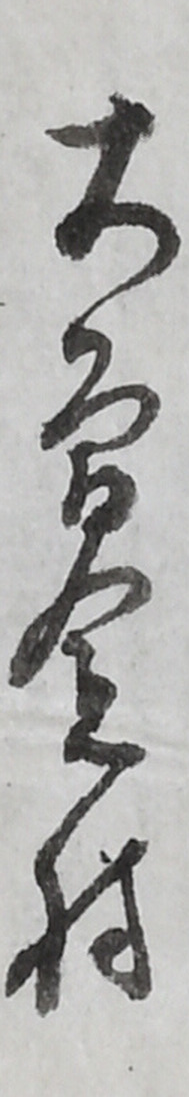大曽倉村
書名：年内行事帳
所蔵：伊那市立高遠町図書館・合同会社AMANE
